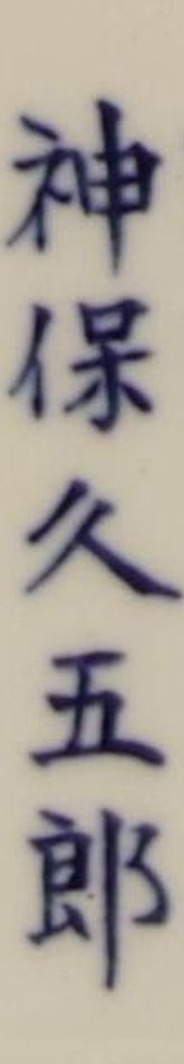神保久五郎

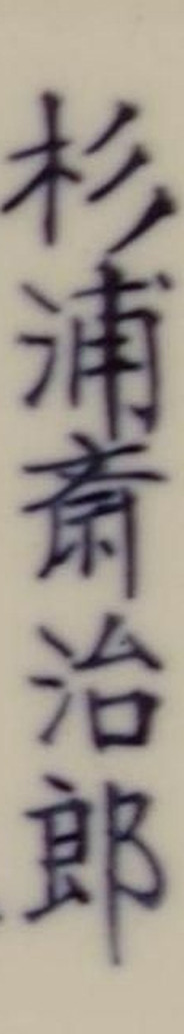杉浦斎治郎
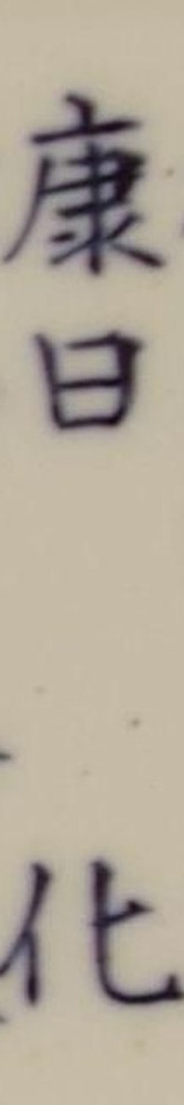康日化
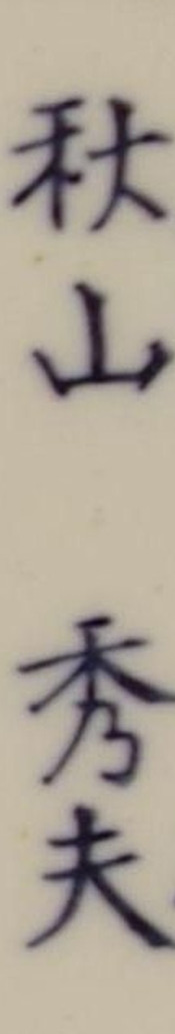秋山秀夫
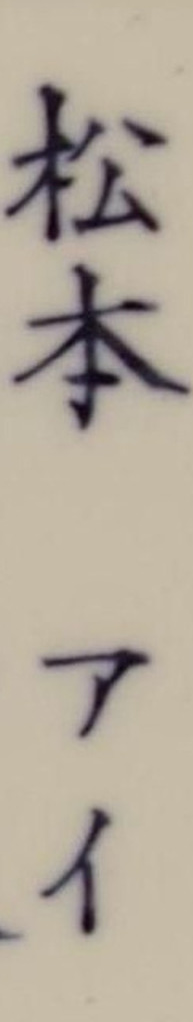松本アイ
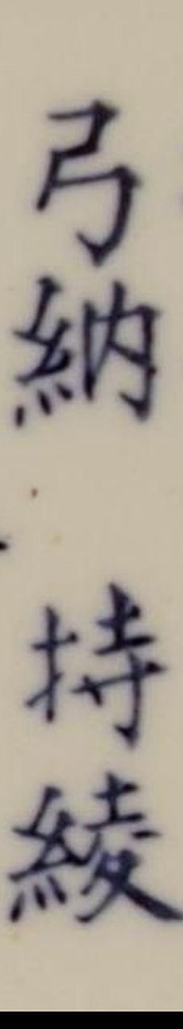弓納持綾
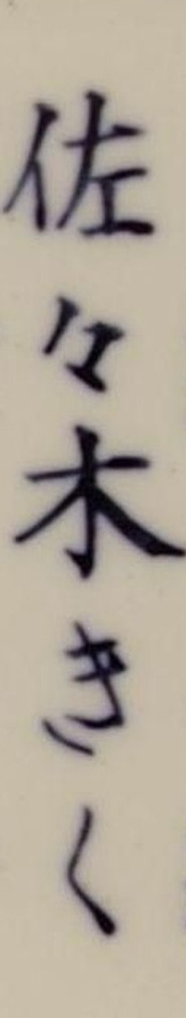佐々木きく
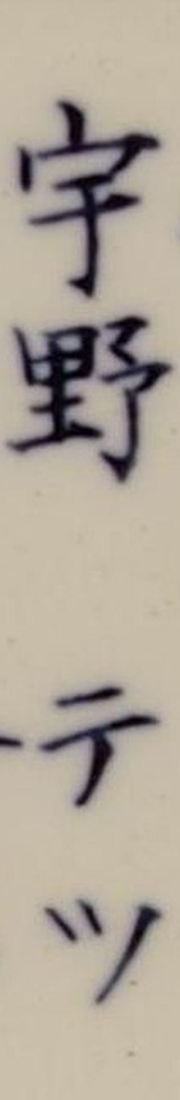宇野テツ
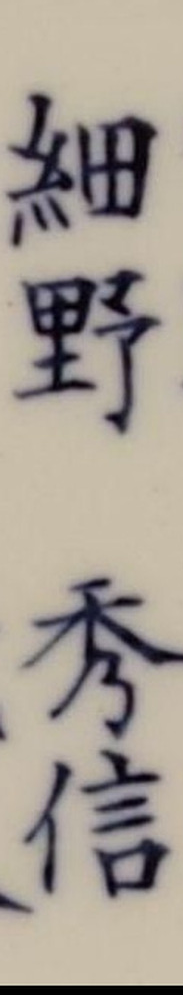細野秀信
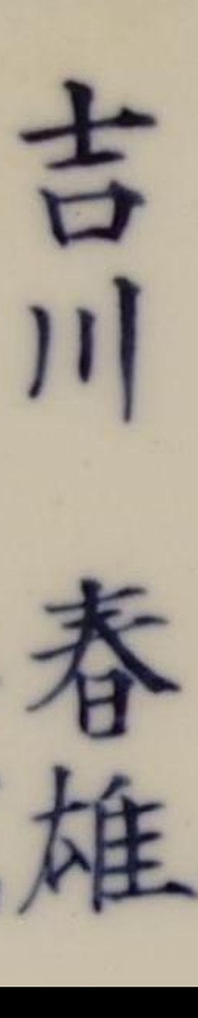吉川春雄
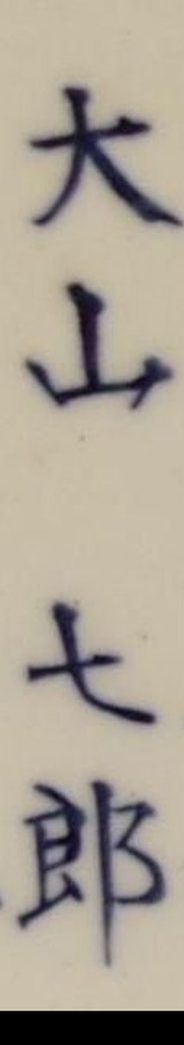大山七郎
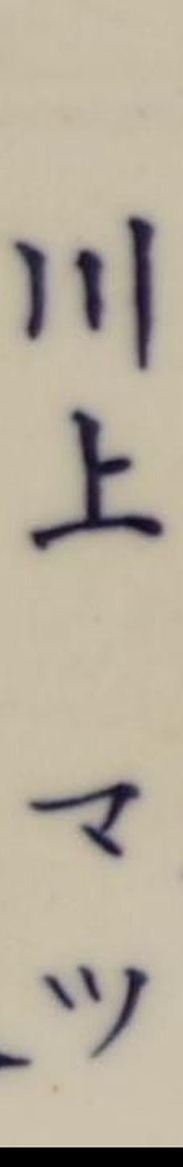川上マツ

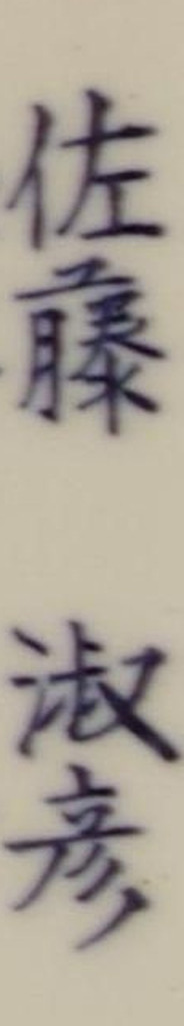佐藤淑彦
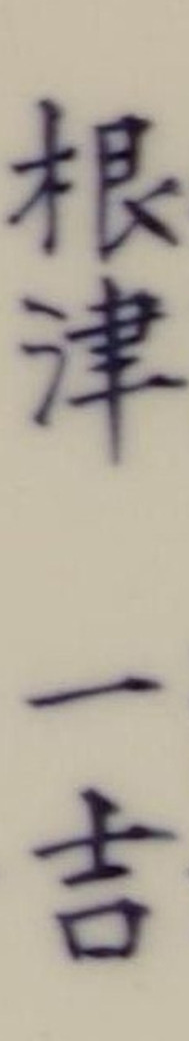根津一吉
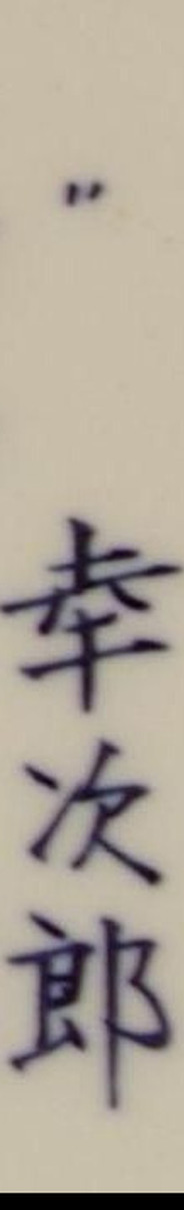幸次郎
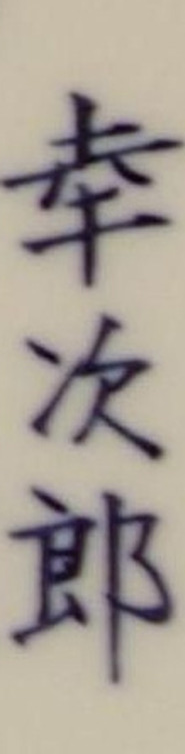幸次郎
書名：E~L
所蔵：高野山金剛峯寺
